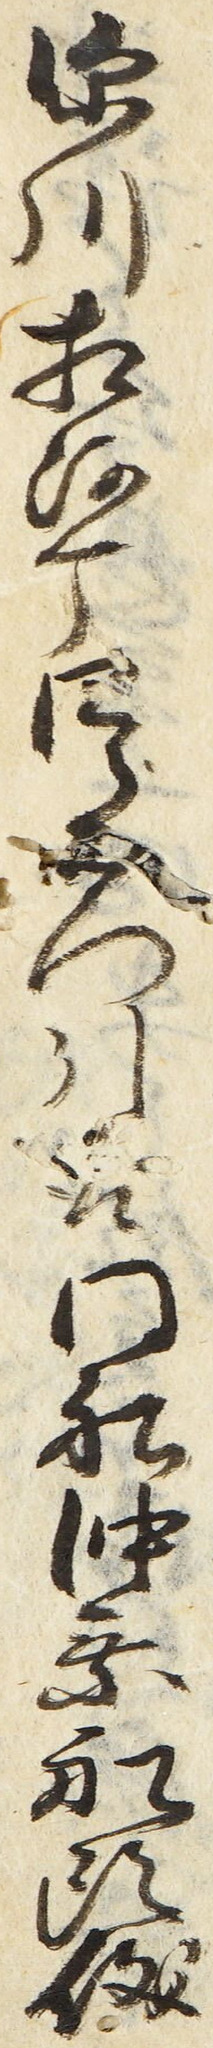深川相河町四郎右衛門引取同船沖乗船頭儀
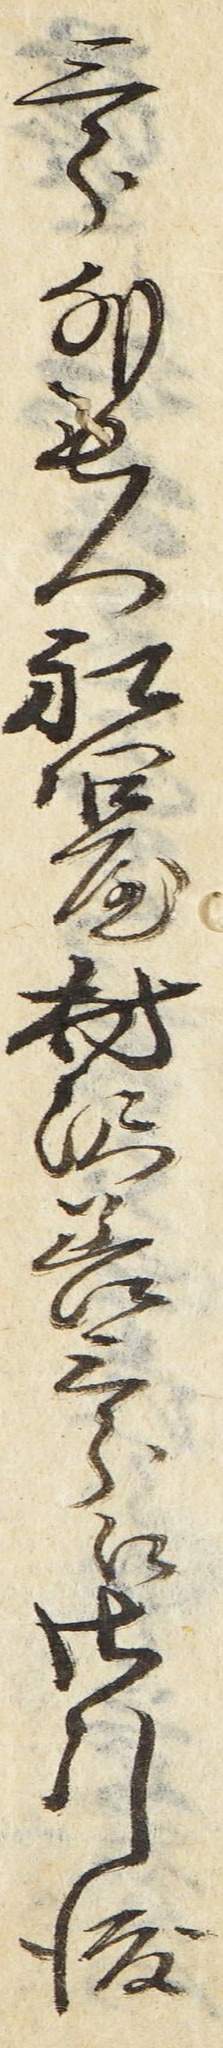三郎外七人船問屋村沢善三郎江御引渡

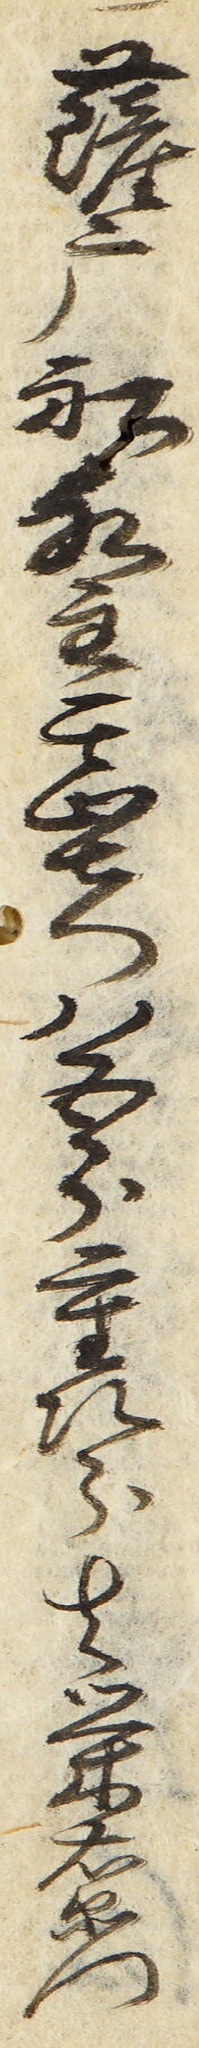薩摩船水主甚右衛門八五郎重次郎者栄右衛門
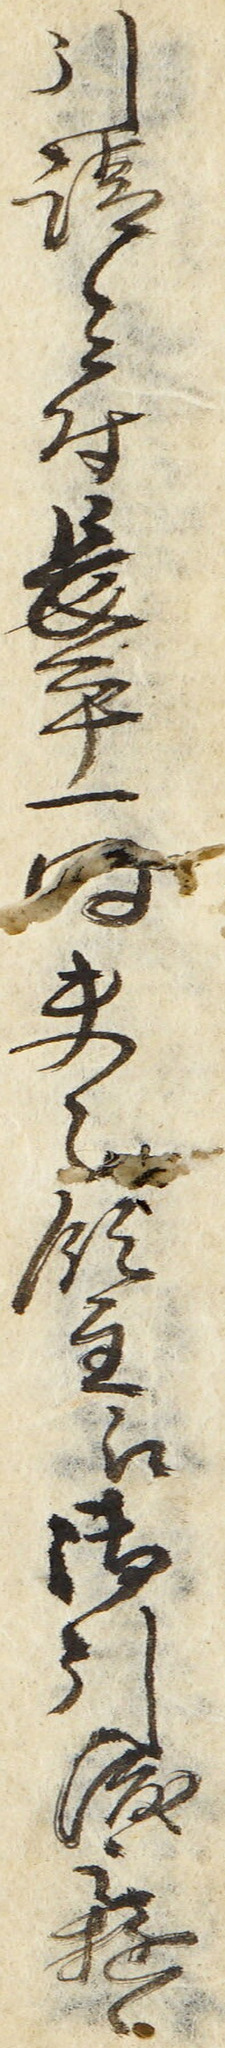引請候ニ付長平一同夫々領主江御引渡被遊候
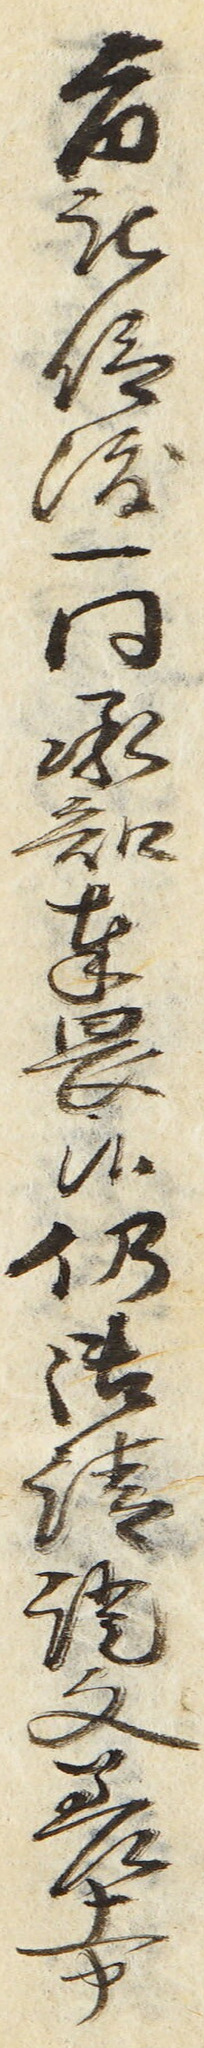旨被仰渡一同承知奉畏候仍御請証文差上申
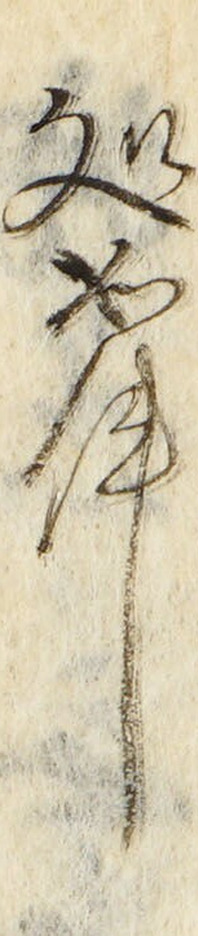処如件
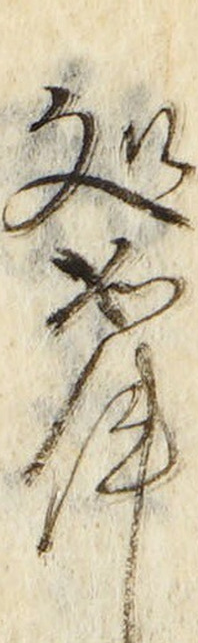処如件
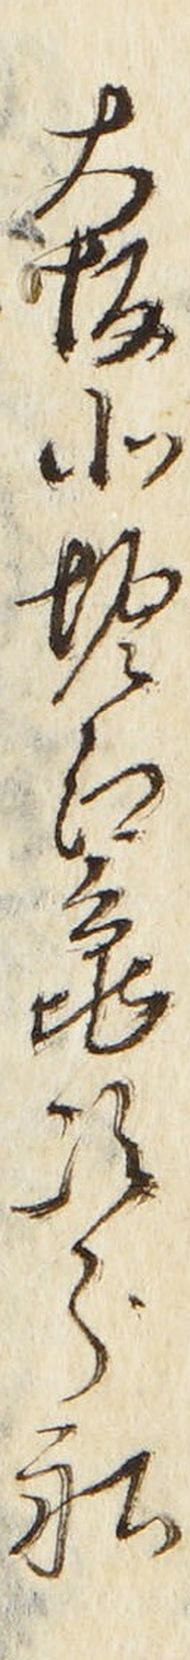大坂北堀江亀次郎船
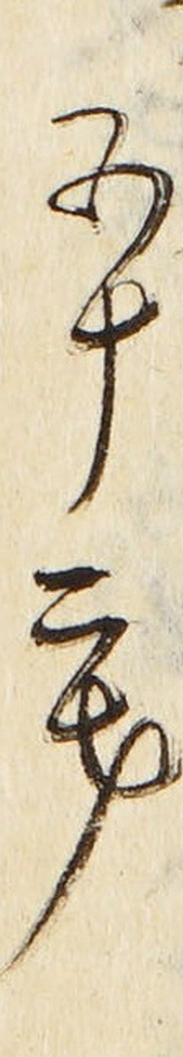五十二才
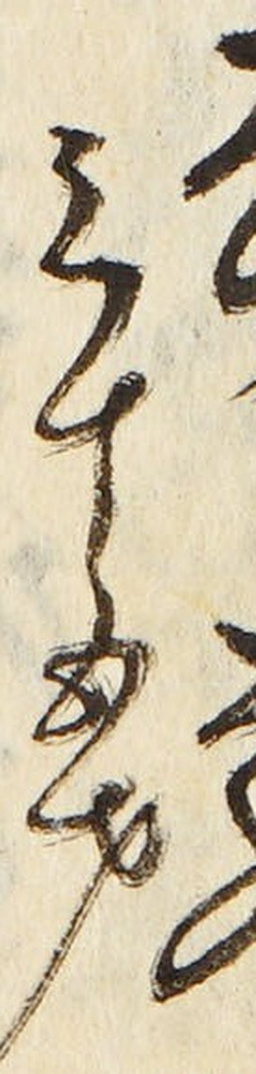三十五才
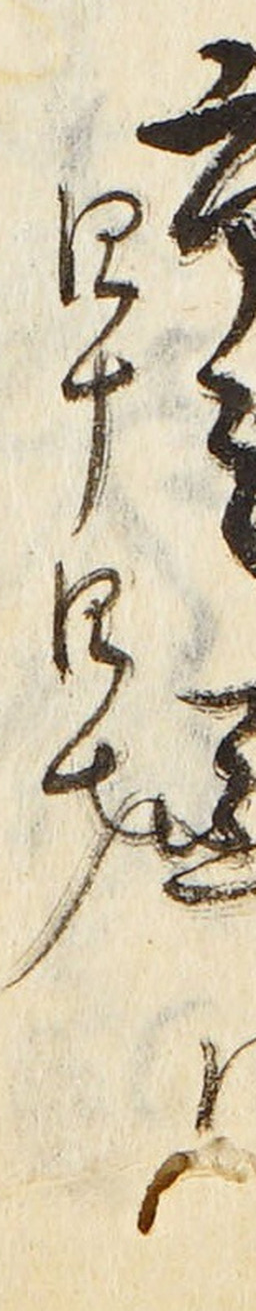四十四才
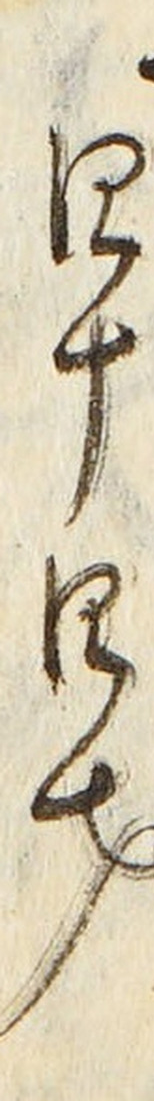四十四才
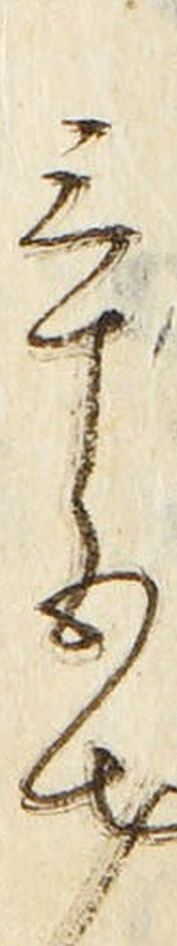三十五才
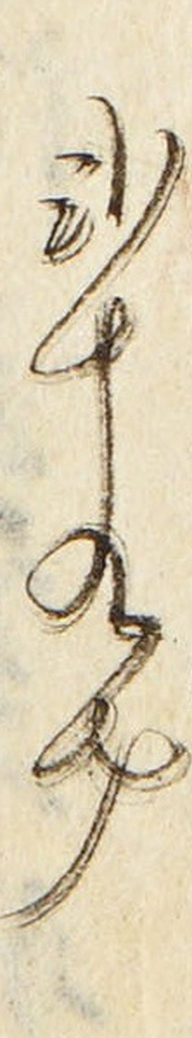弐十九才
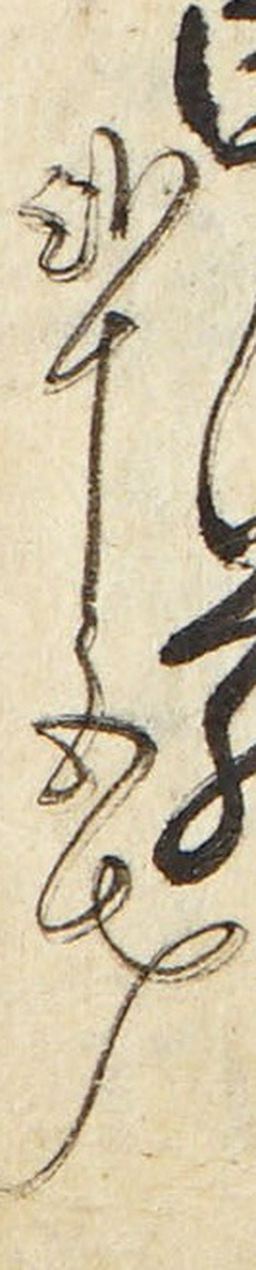弐十五才

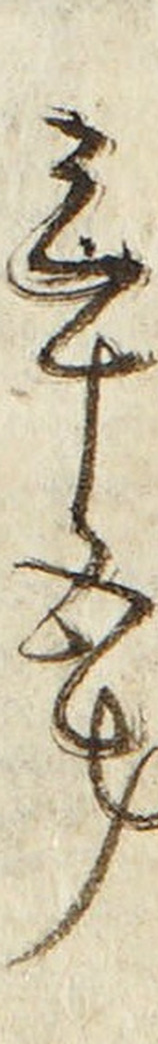三十五才
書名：漂流一件上書
